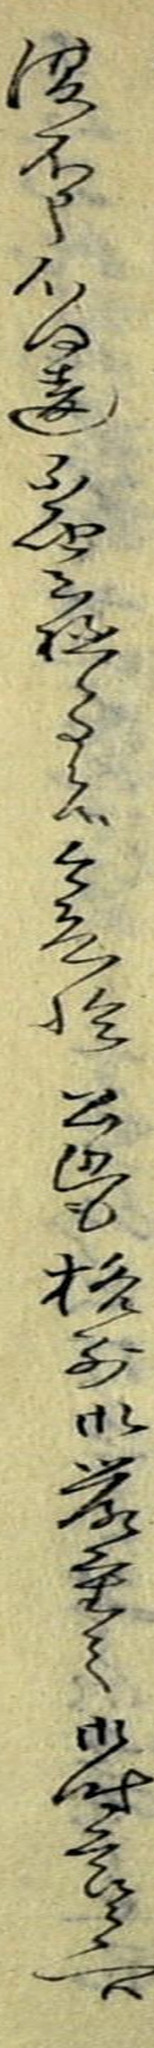復不申心得違不届至極之事に候今度於公辺も格別御厳重之御時節に候へは

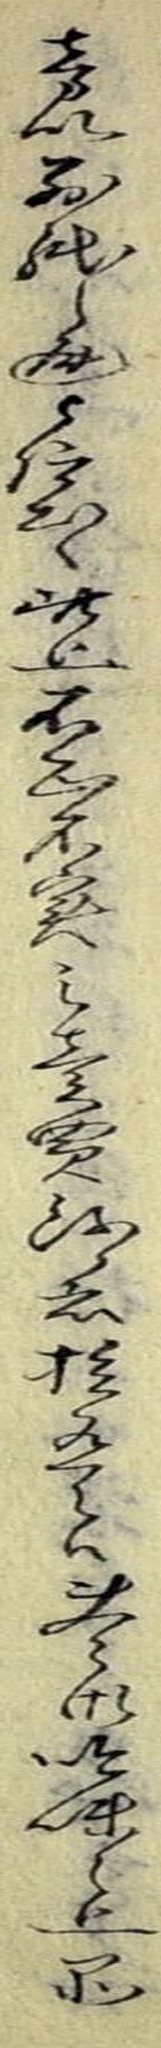旁以別紙之通被仰出候此上不正不実之売買致候者於有之は夫々御吟味之上品
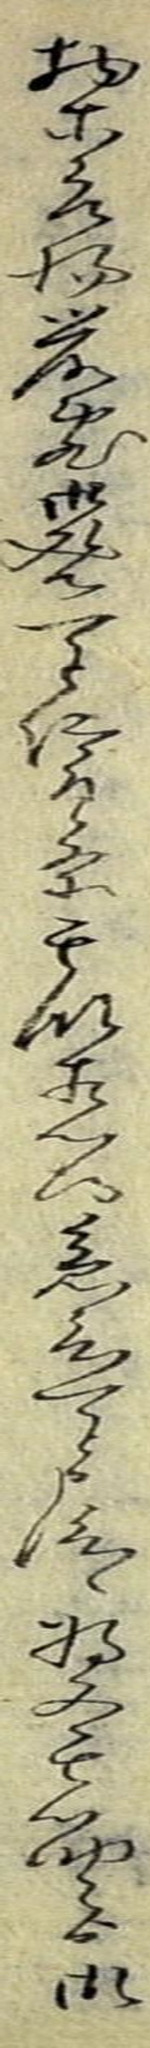物等取揚厳敷御咎可被仰付候条其段相心得急度可被申渡候猶又其筋々ゟ御
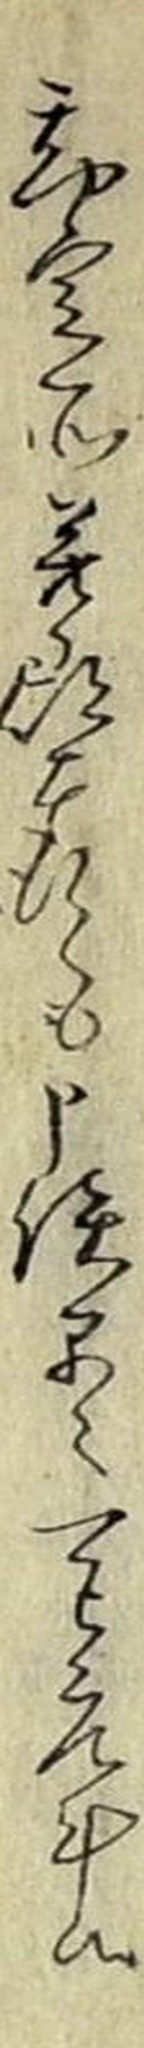勘定所并郡奉行へも申談早々可被取斗候
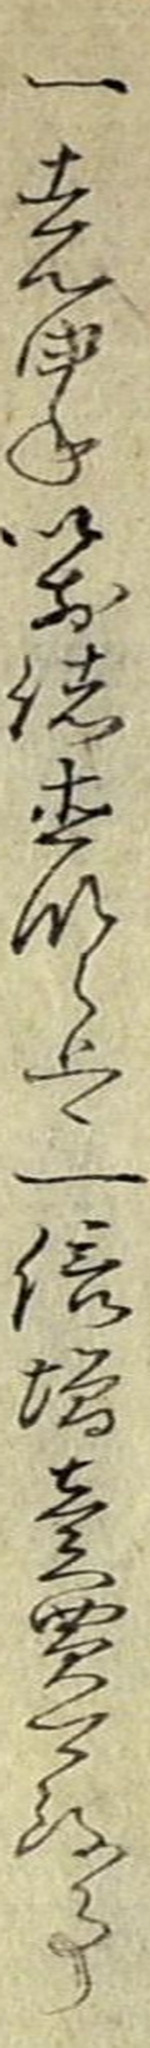一去ル申年以前諸直段之上へ一倍増売買可致事
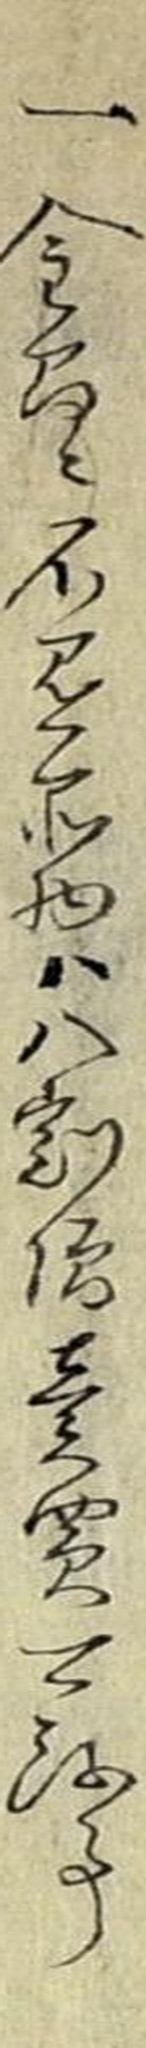一金品に不懸品物は八割増売買可致事
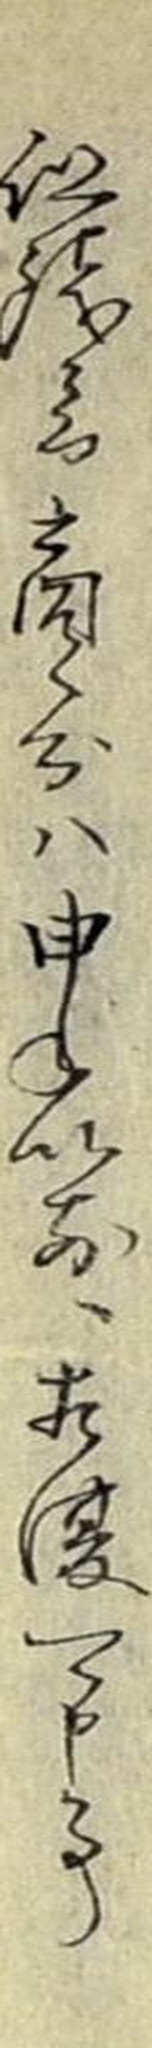但銭に而商之分は申年以前へ相復可申事
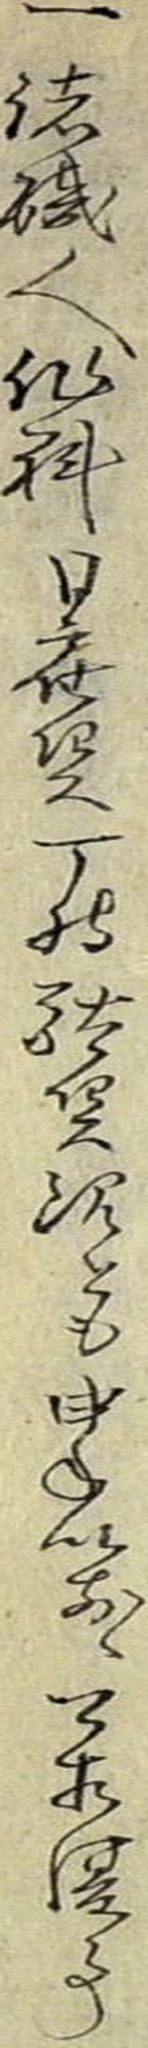一諸職人作料日雇賃丁持駄賃銀とも申年以前へ可相復事
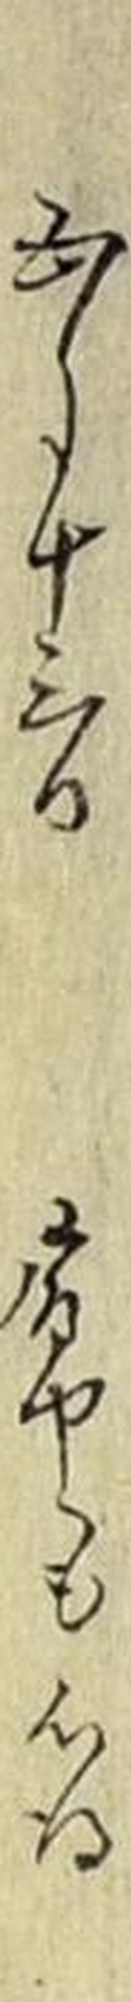五月十三日府中へも心得
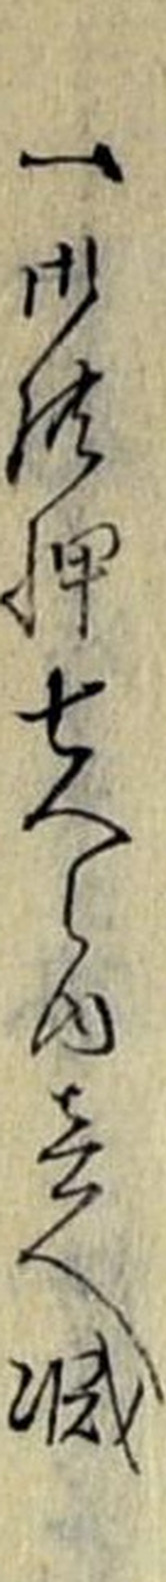一御供押七人之内壱人減
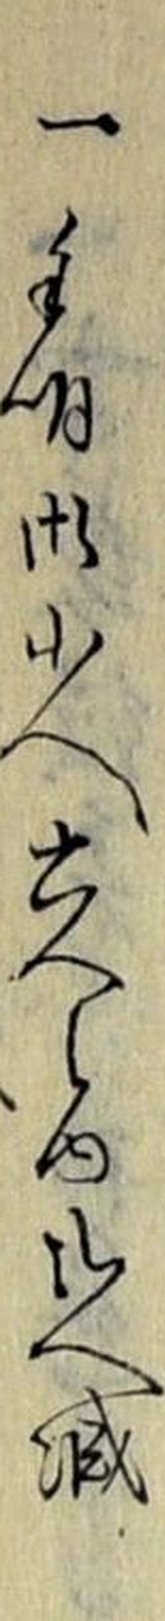一手明御小人六人之内弐人減
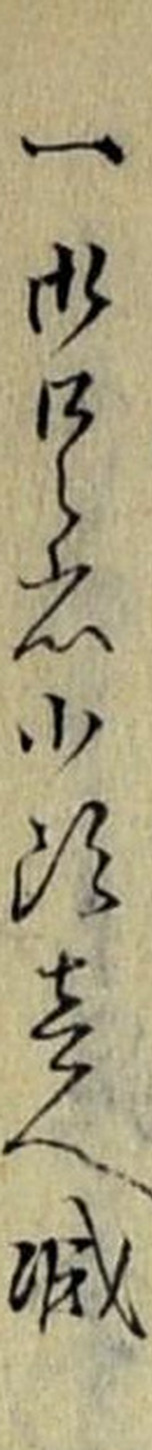一御口之者小頭壱人減
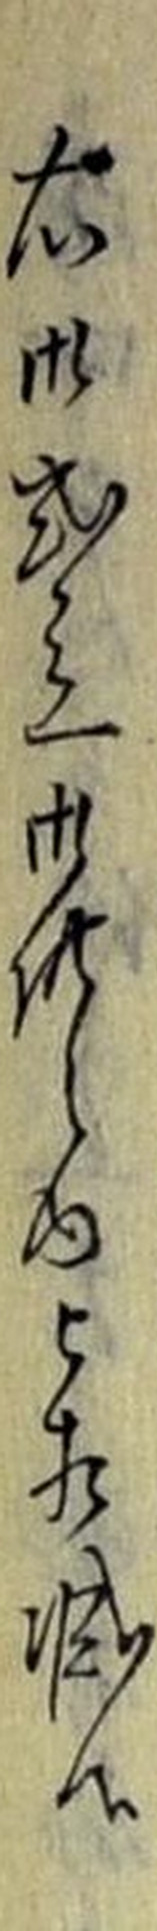右御式立御供之内被相減候
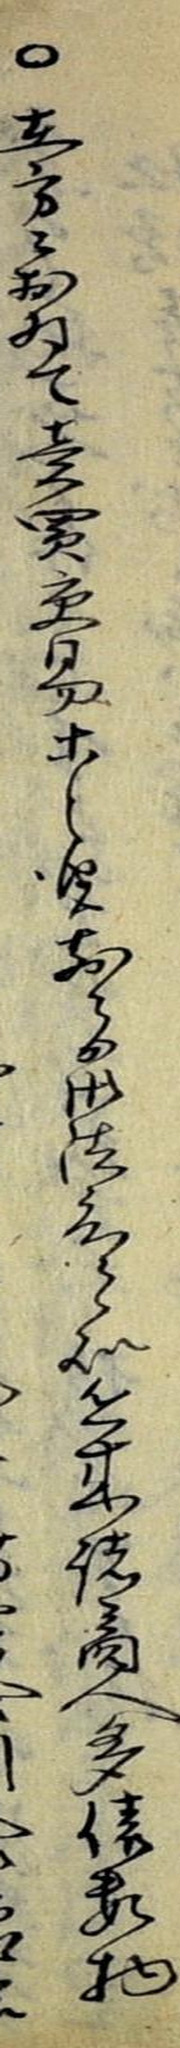○在方におゐて売買交易等之儀前々ゟ御法度に候処近来諸商人多俵数物
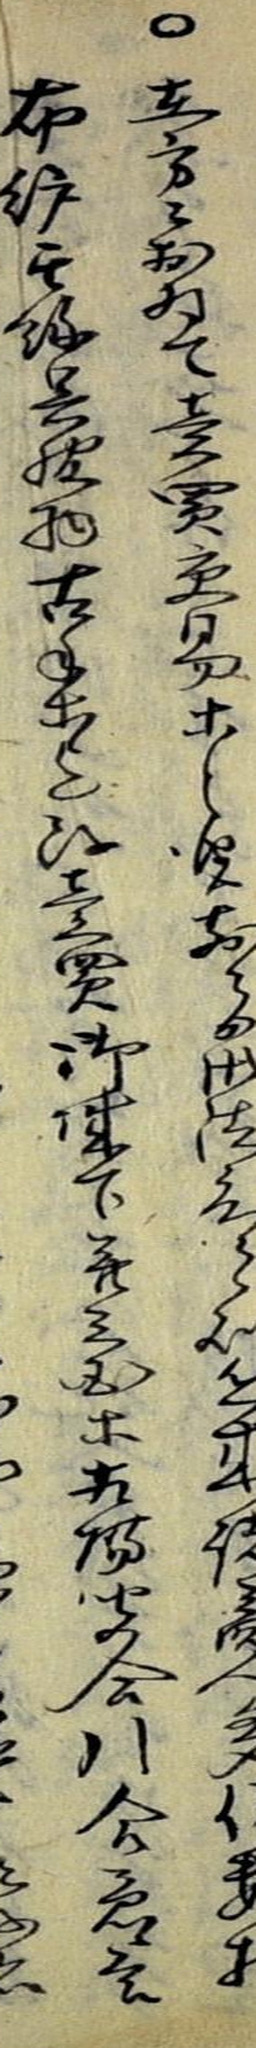布䋆其餘呉服物古手等迄致売買御城下并三国等相場聞合引合兼候節
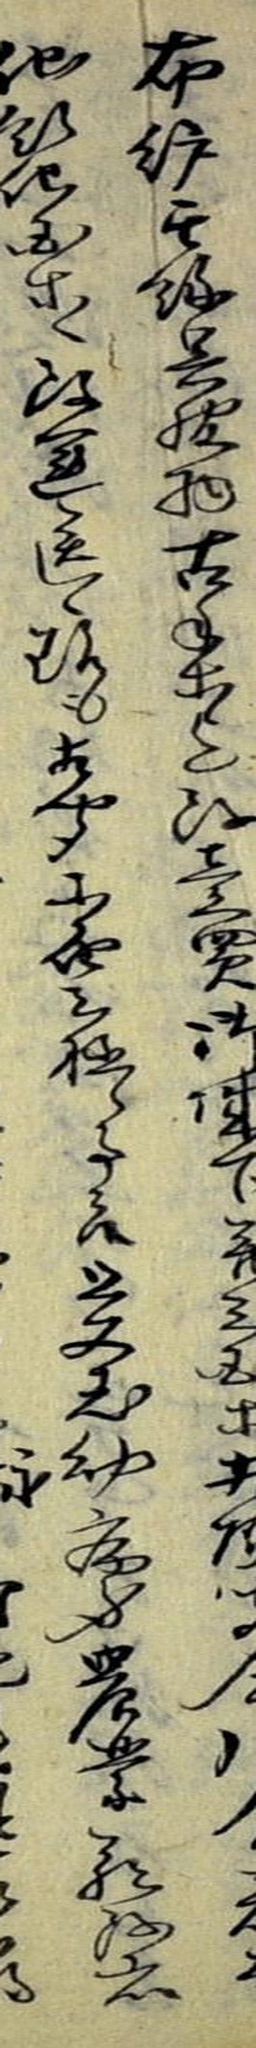他領他国等へ致運送候趣も相聞不届至極之事に候且又老幼病身農業難致者
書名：命令之部 六
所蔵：福井県文書館 Fukui Prefectural Archives
